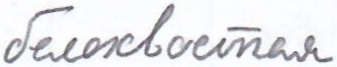белохвостая
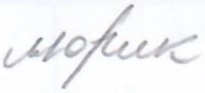люрик
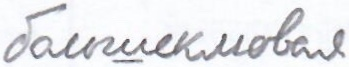большеклювая
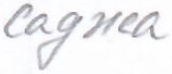саджа
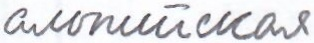альпийская
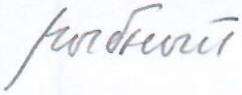рыбный
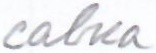савка
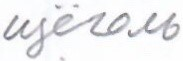щёголь
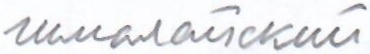гималайский
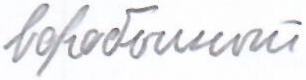воробьиный
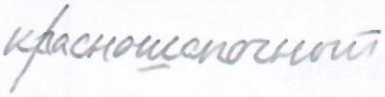красношапочный
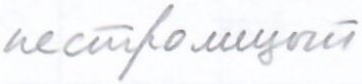пестролицый
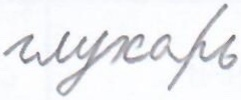глухарь
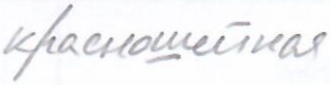красношейная
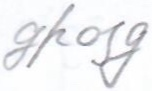дрозд
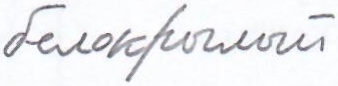белокрылый
